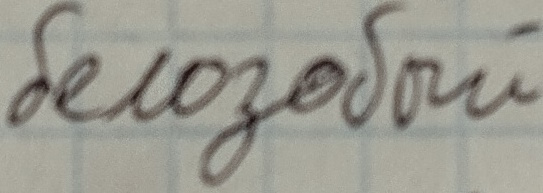белозобый
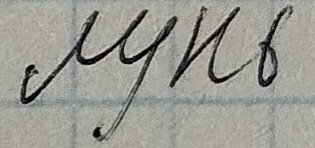лунь
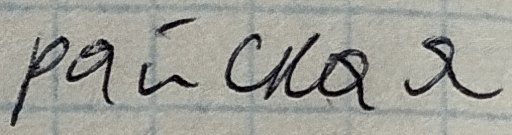райская
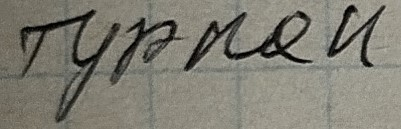турпан
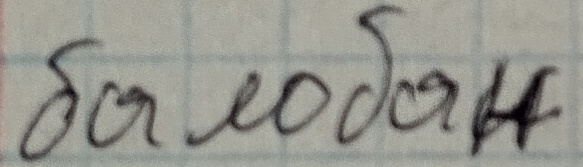балобан
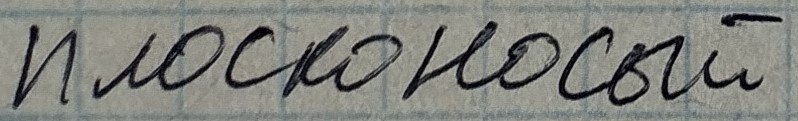плосконосый
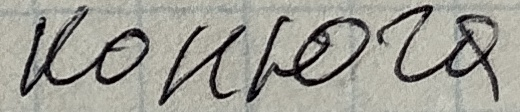конюга
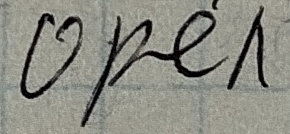орёл
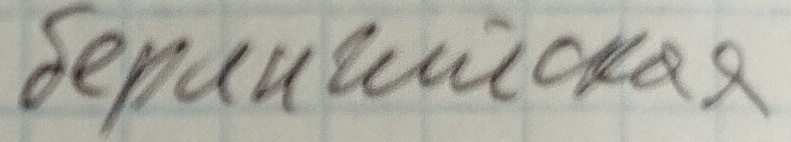берингийская
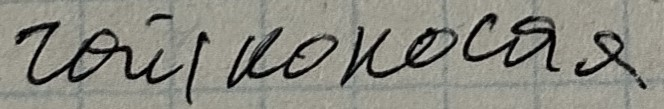чайконосая
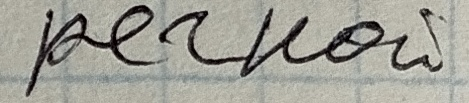речной
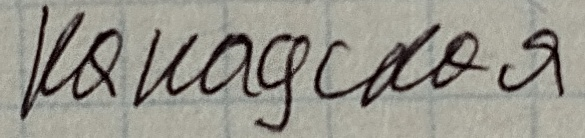канадская
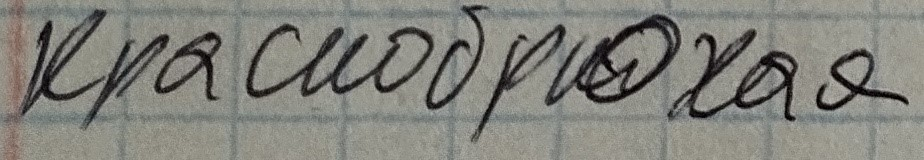краснобрюхая
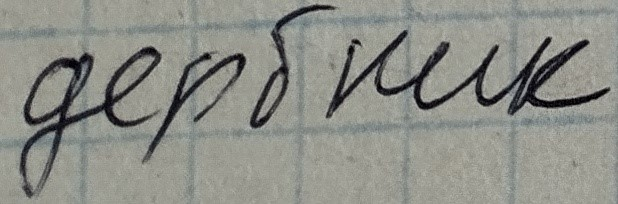дербник
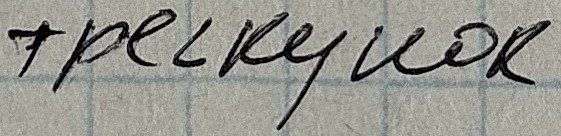трескунок
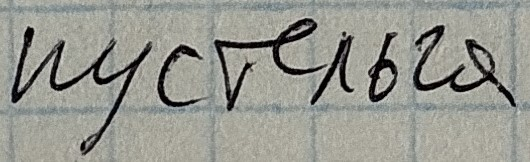пустельга
